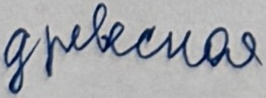древесная
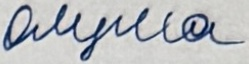олуша
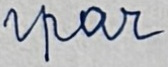грач
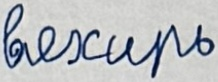вяхирь
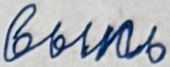выпь
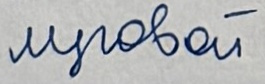луговой
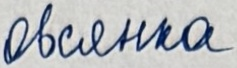овсянка
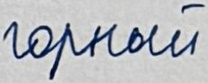горный
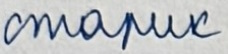старик
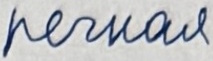речная
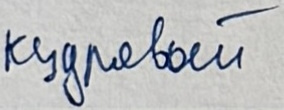кудрявый
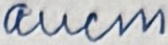аист
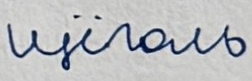щёголь
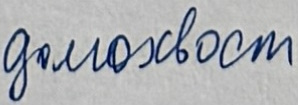долгохвост
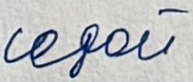седой
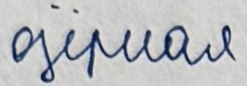озёрная
